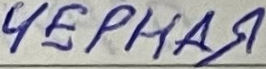черная
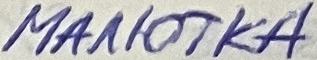малютка
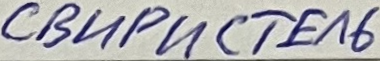свиристель
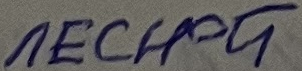лесной
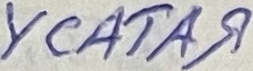усатая
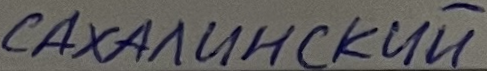сахалинский
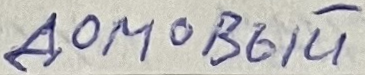домовый
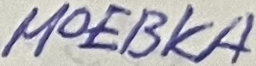моевка
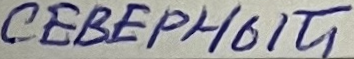северный
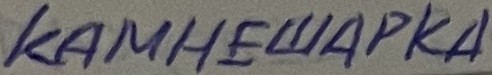камнешарка
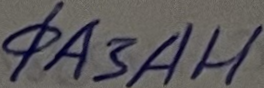фазан
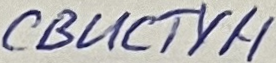свистун
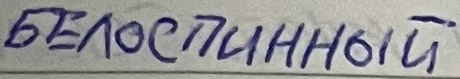белоспинный
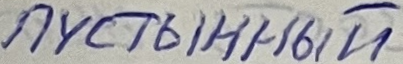пустынный
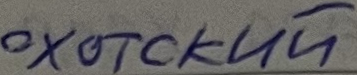охотский
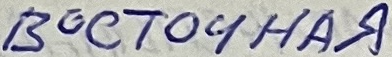восточная
